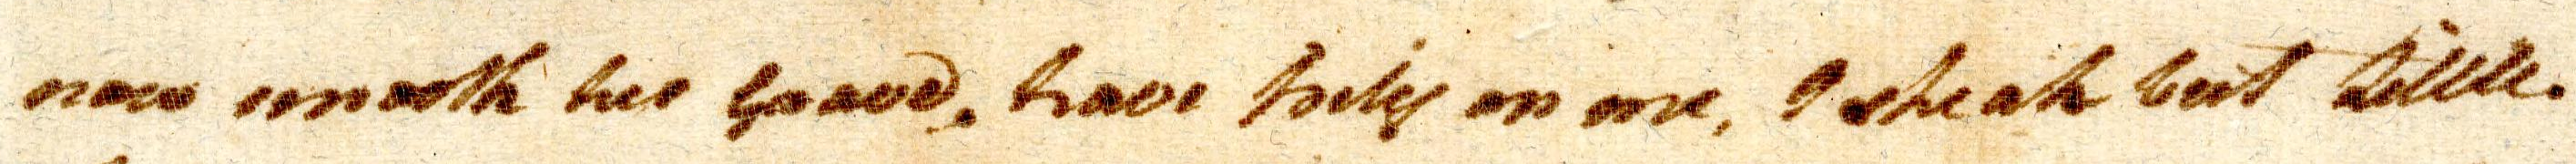now smooth his Grave, have pity on me, I speak but Little.
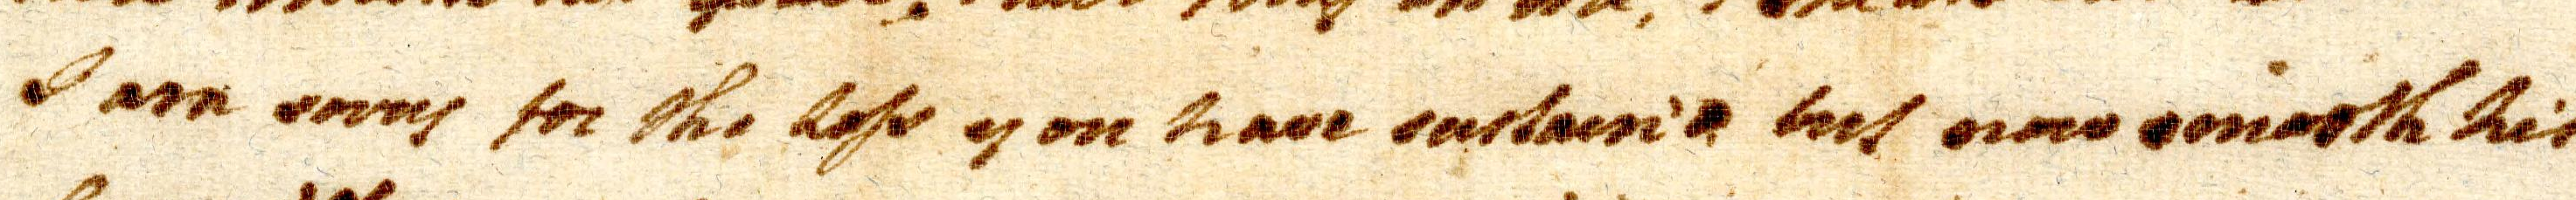I am sorry for the loss you have sustain'd but now smooth his
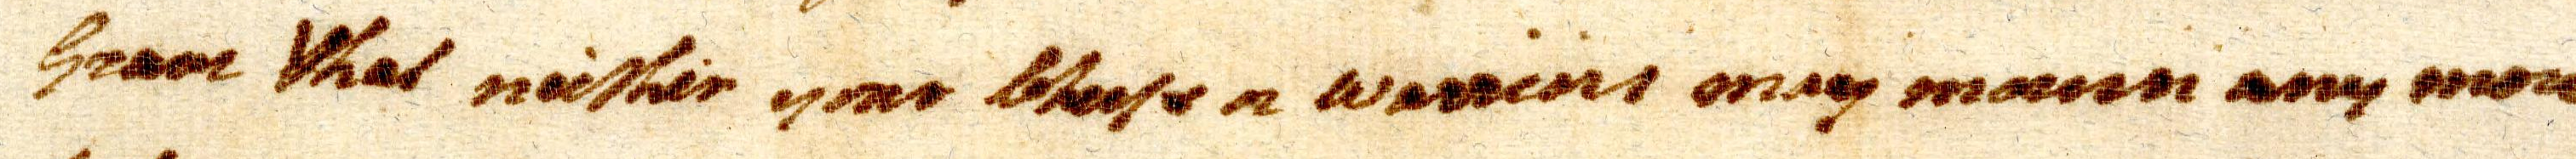Grave that neither your Chiefs or warriors may mourn any more
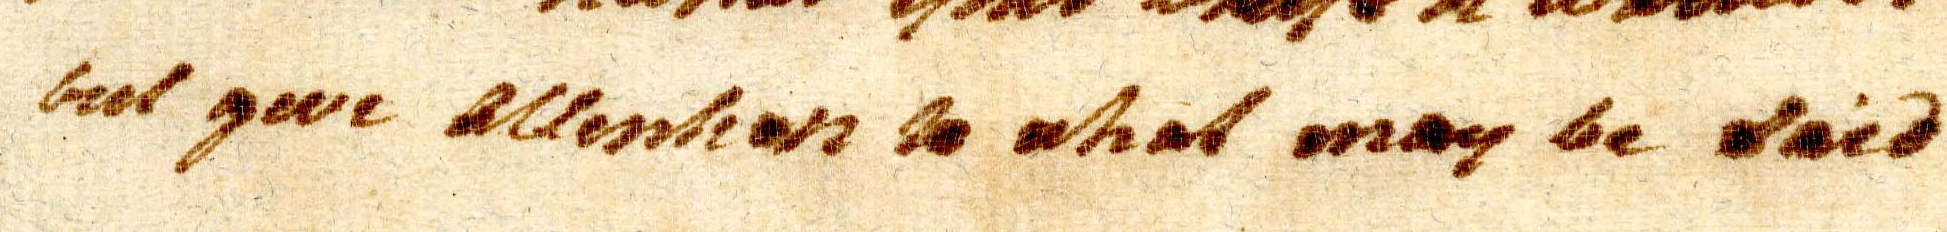but give attention to what may be said.
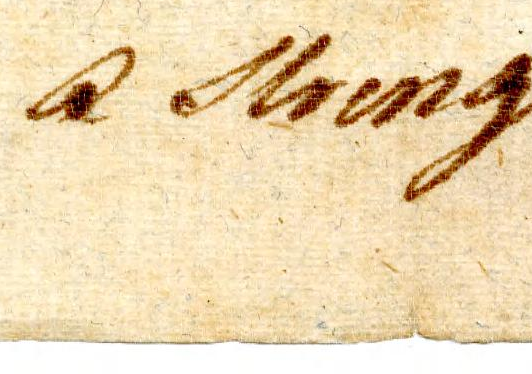A String
